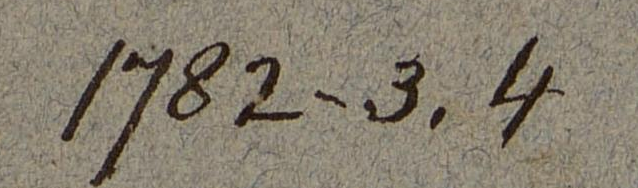1782-3. 4
